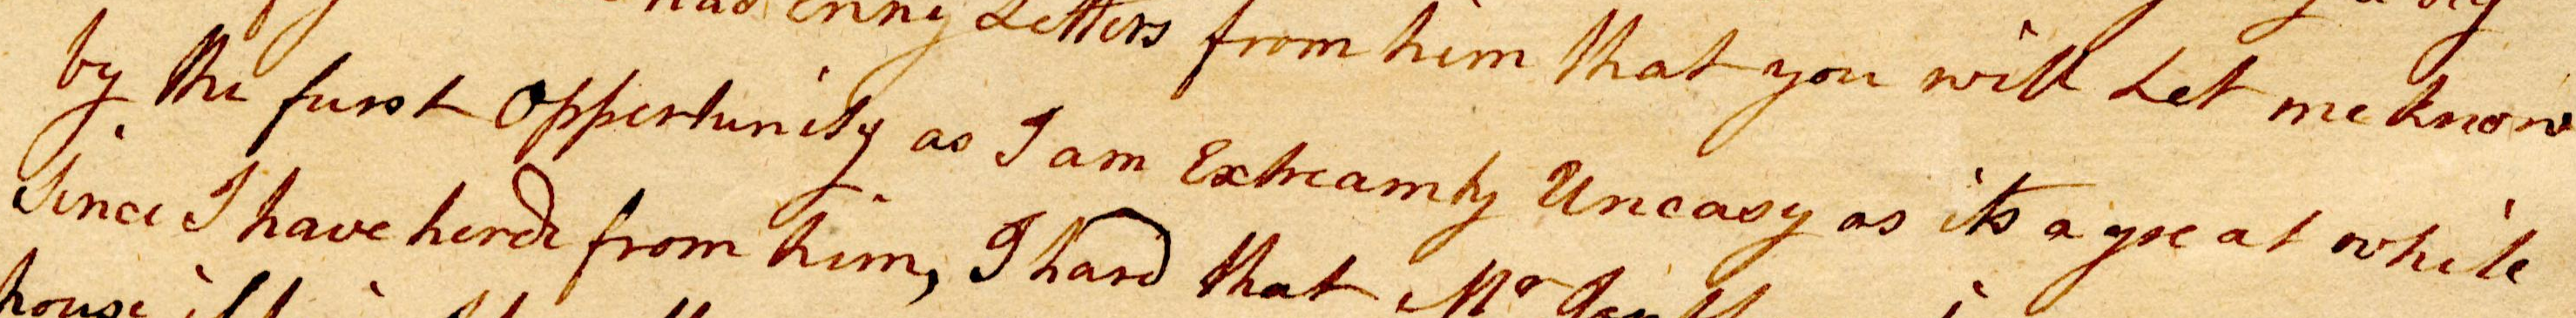by the first oppertunity as I am Extreamly uneasy as its a great while
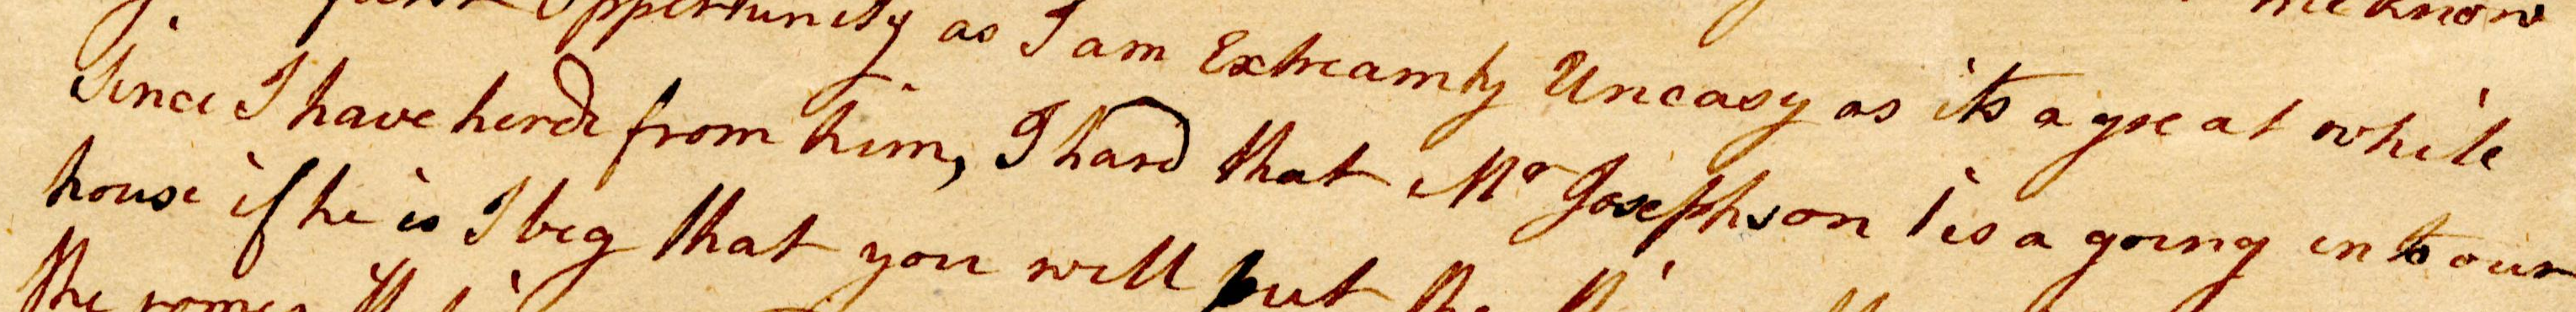Since I have herde from him, I hard that M^r Josephson is a going into our
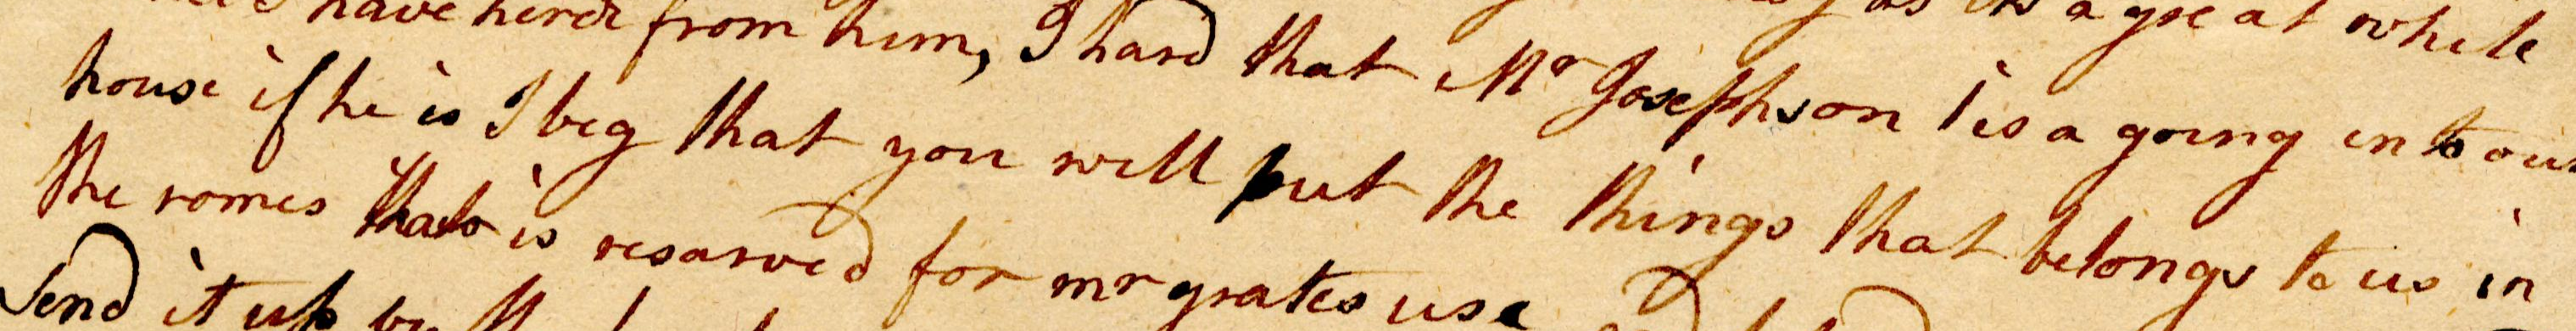house if he is I beg that you will put the things that belongs to us in
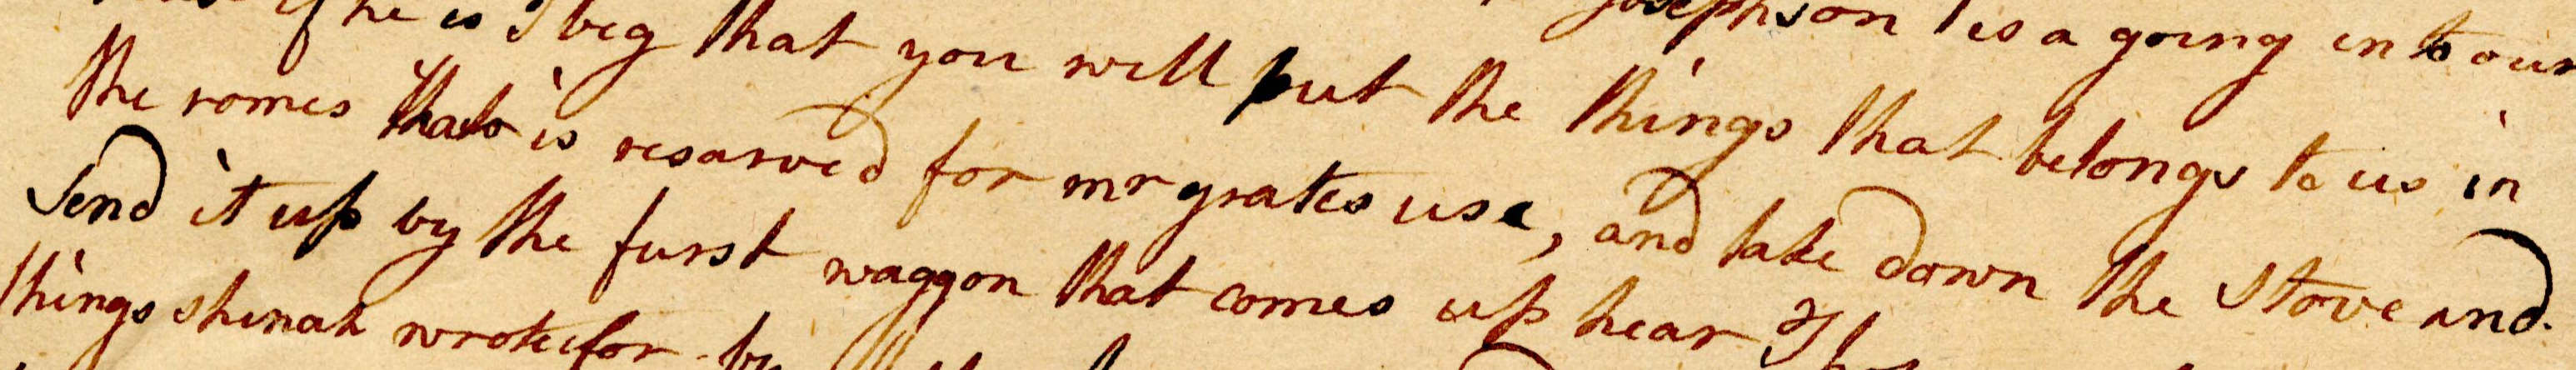the romes that is reserved for M^r grates use, and take down the stove and
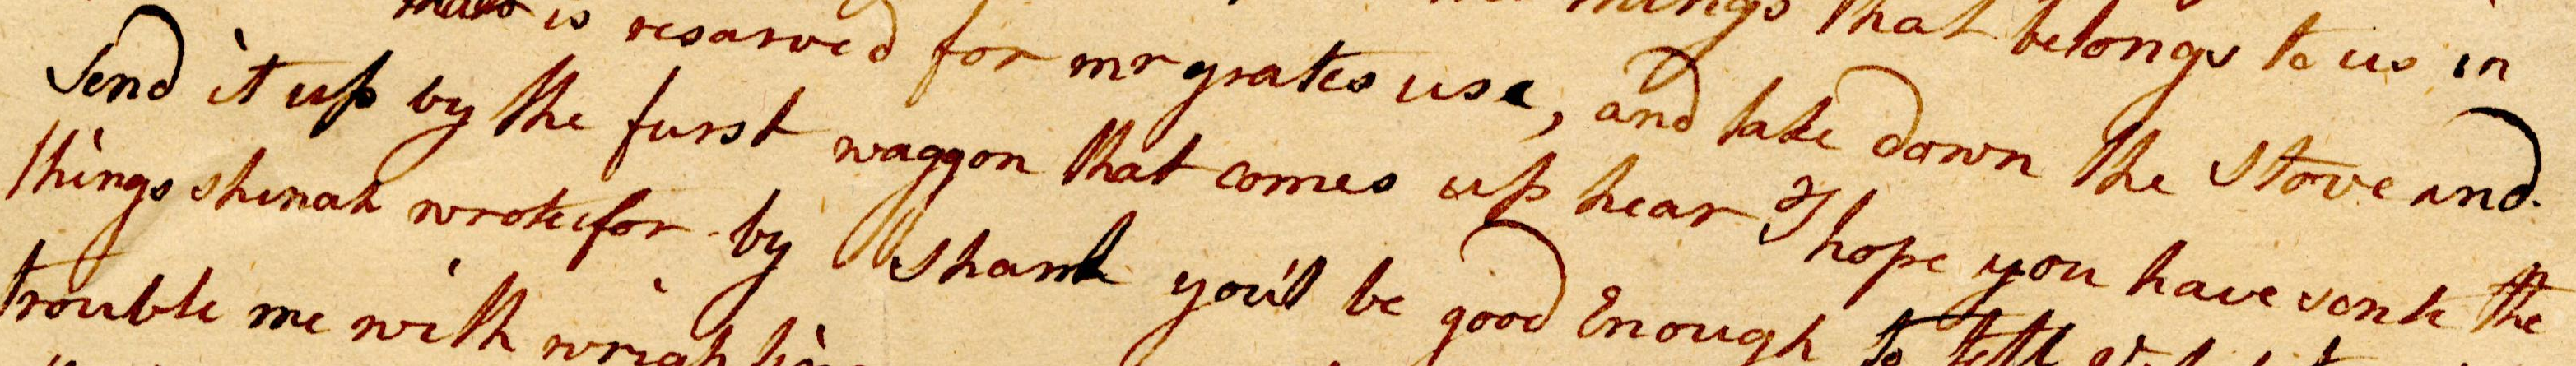send it up by the furst waggon that comes up hear I hope you have sent the
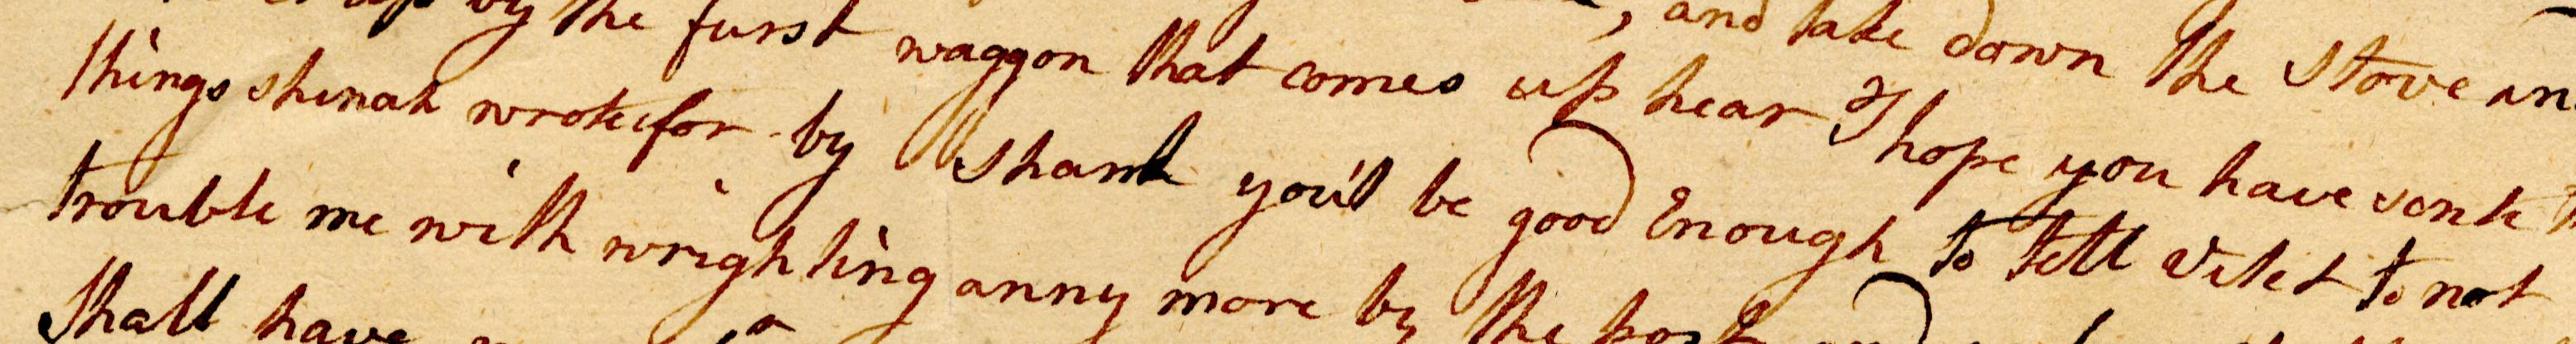things shenah wrote for by Shank you'l be good enough to tell Vilet to not
